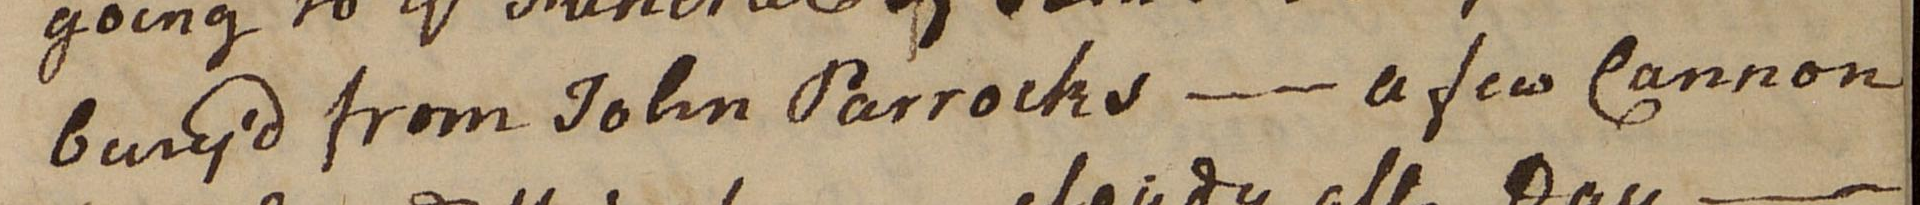bury'd from John Parrocks- a few Cannon
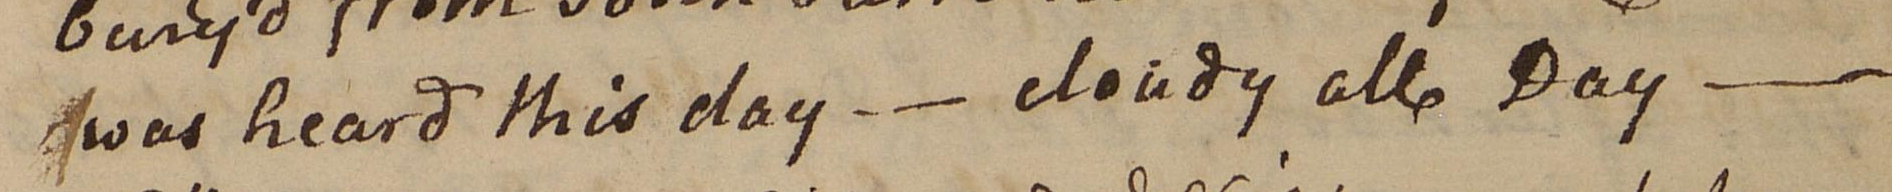was heard this day - cloudy all Day-
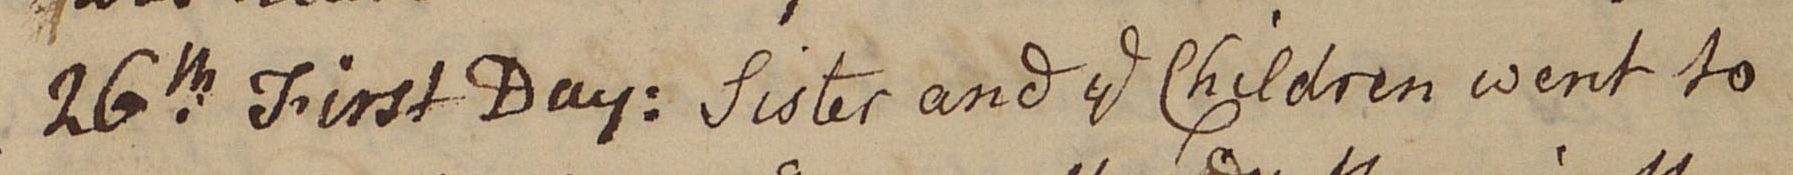26^th. First Day: Sister and y^e Children went to
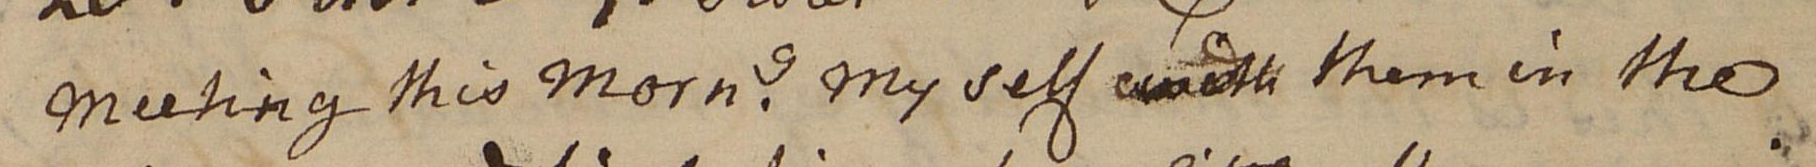Meeting this Morn^g. my self [with] them in the
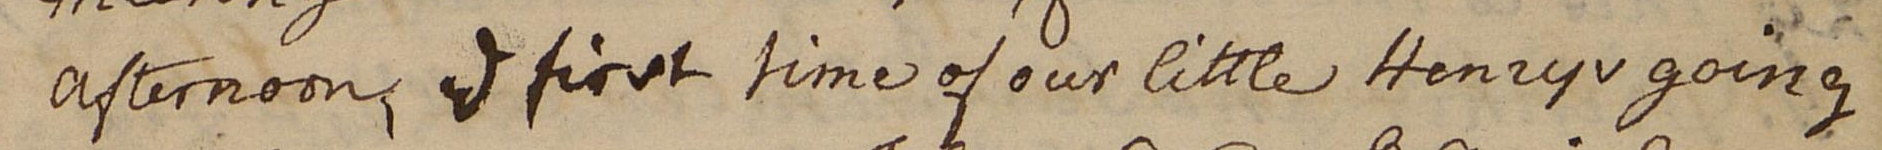Afternoon y^e first time of our little Henrys going
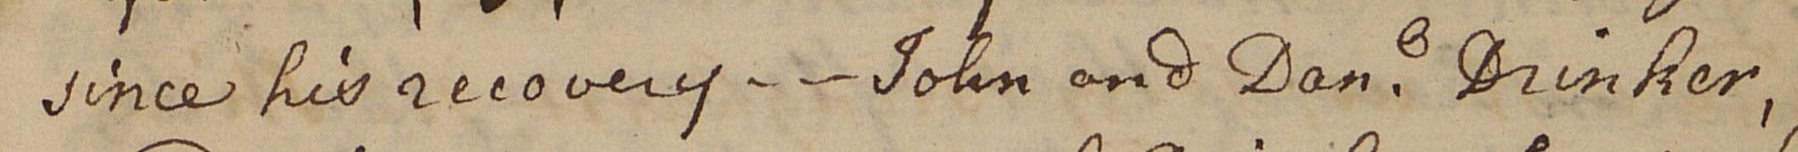since his recovery-- John and Dan^l. Drinker,
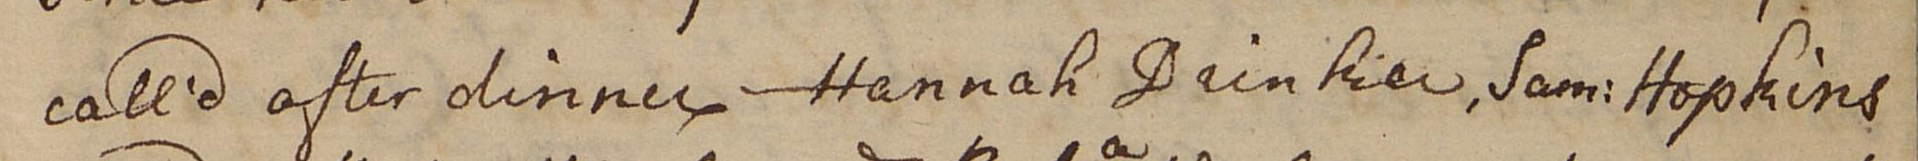call'd after dinner- Hannah Drinker, Sam: Hopkins
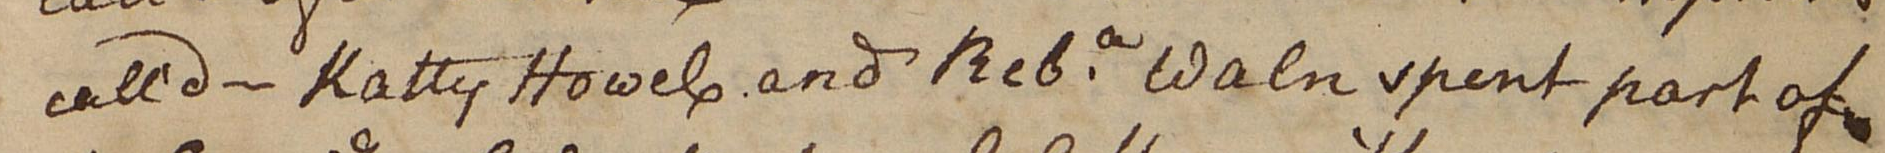call'd- Katty Howel and Reb^a. Waln spent part of
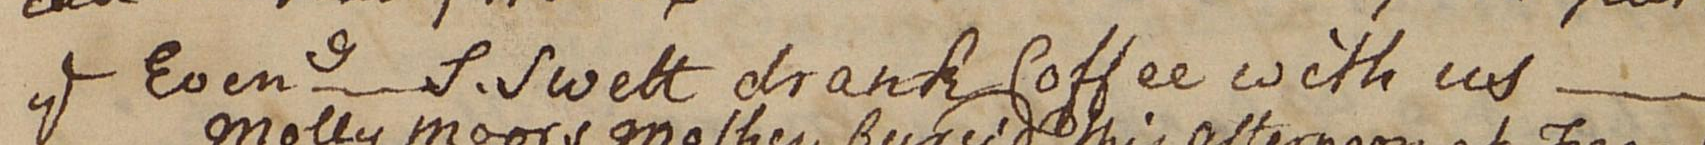y^e Even^g- S. Swelt drank Coffee with us-
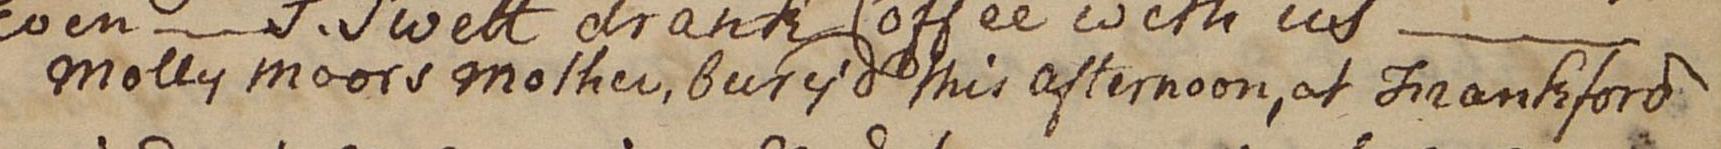Molly Moors Mother, bury d this Afternoon, at Frankford
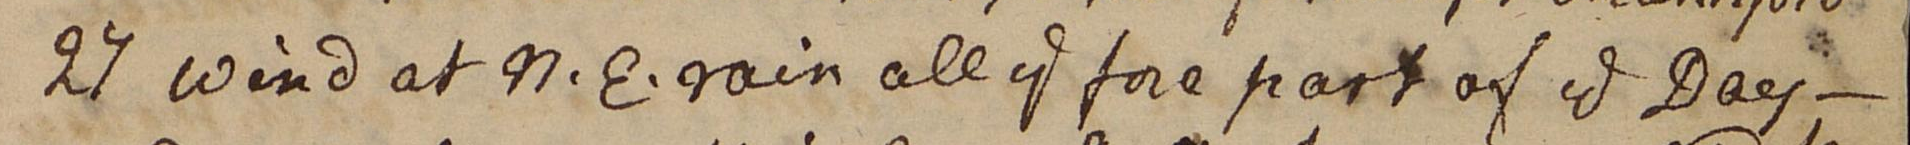27 wind at N.E. rain all y^e for a part of y^e Day-
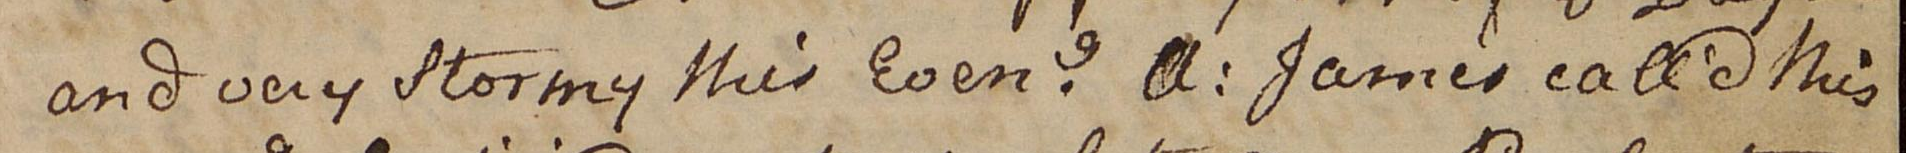and very Stormy this Even^g. A: James call'd this
